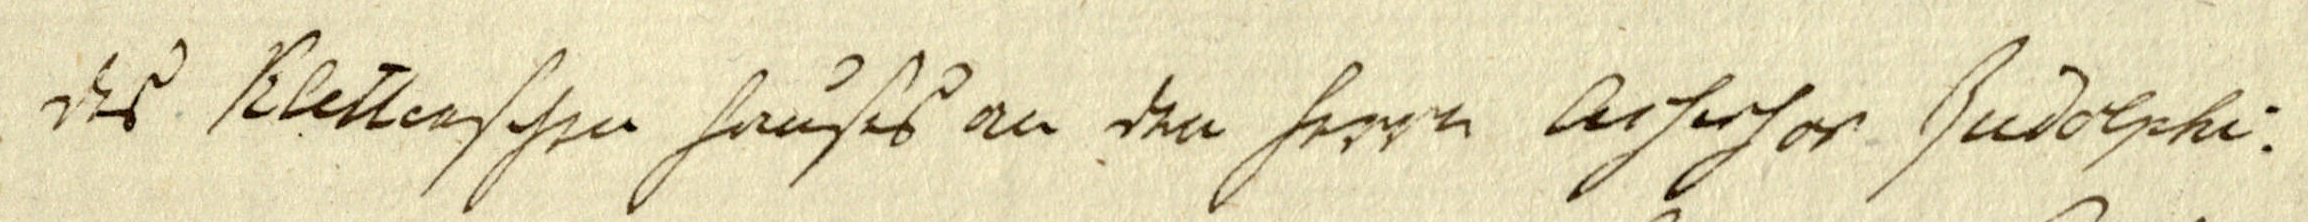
des Klettenschen Hauses an den herrn Assessor Rudolphi.
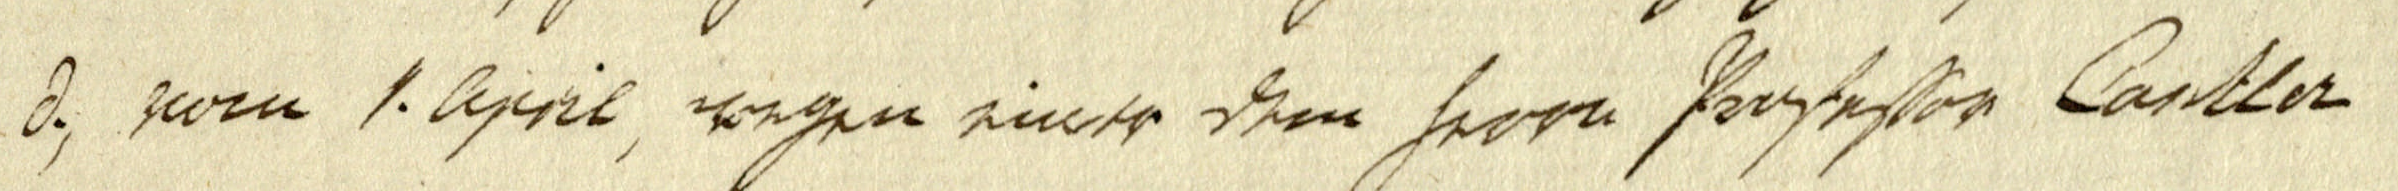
d, vom 1. April, wegen einer dem herrn Professor Canzler
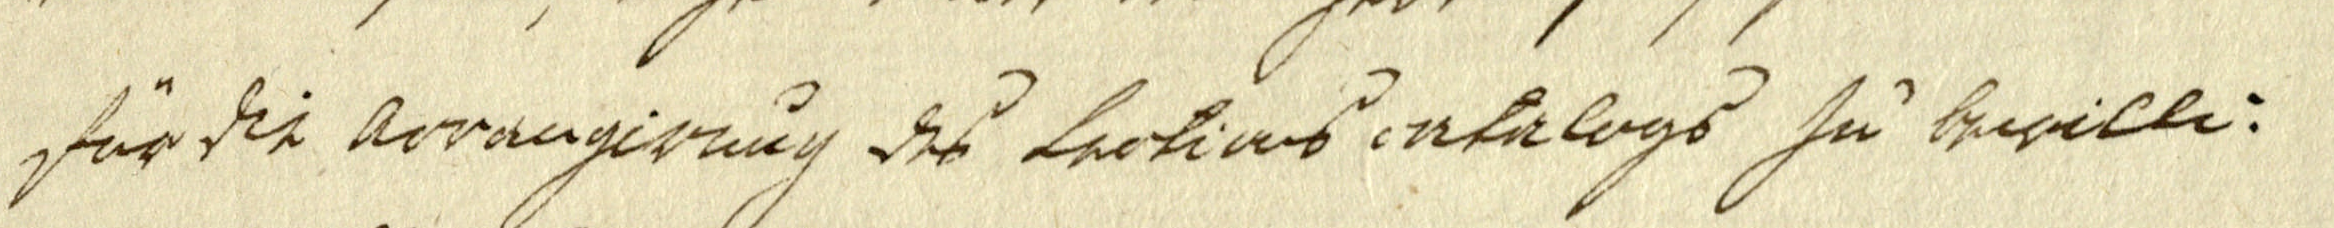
für die Arrangirung des Lections catalogs zu bewilli¬
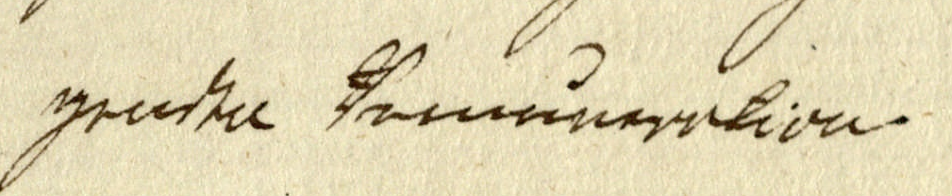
genden Remuneration.
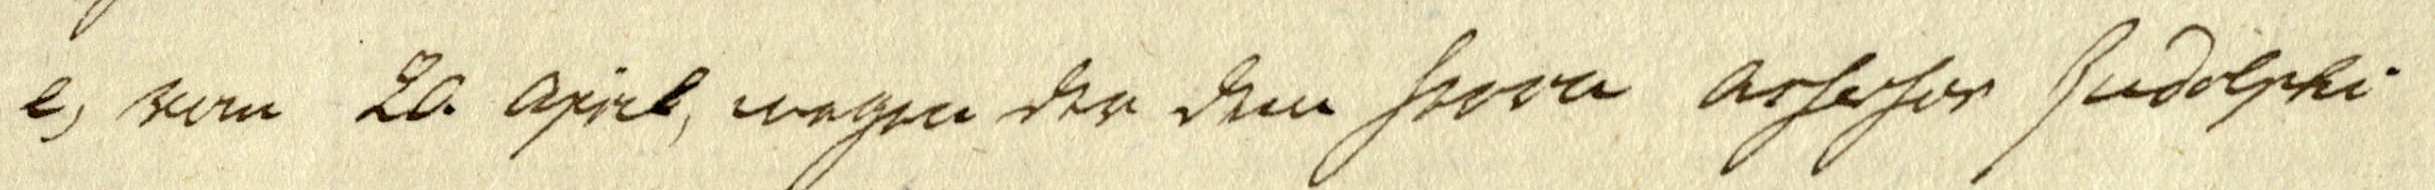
e, vom 20. April, wegen der dem herrn Assessor Rudolphi
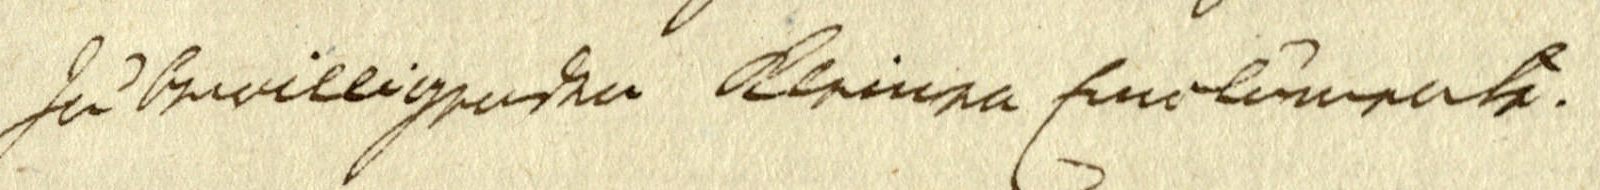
zu bewilligenden kleinen Emolumente.
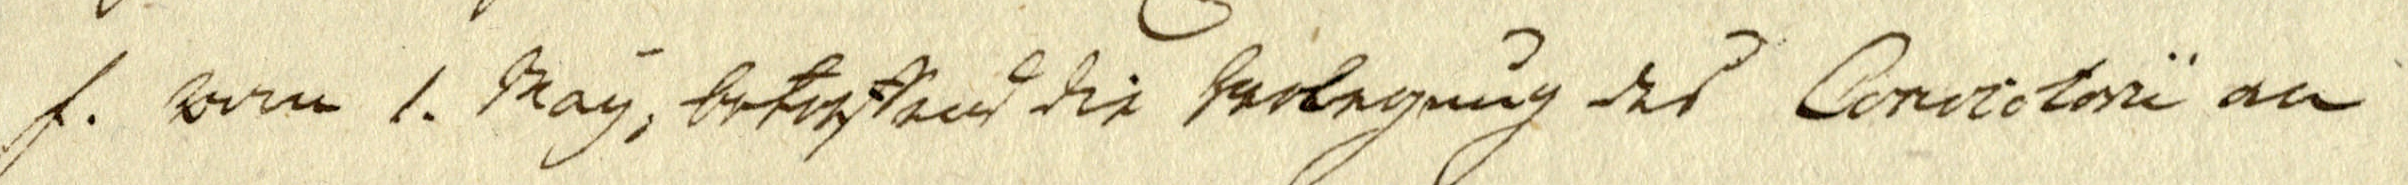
f. vom 1. Maÿ, betreffend die Verlegung des Convictorii an
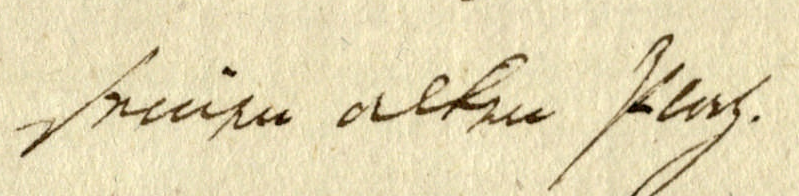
seinen alten Platz.
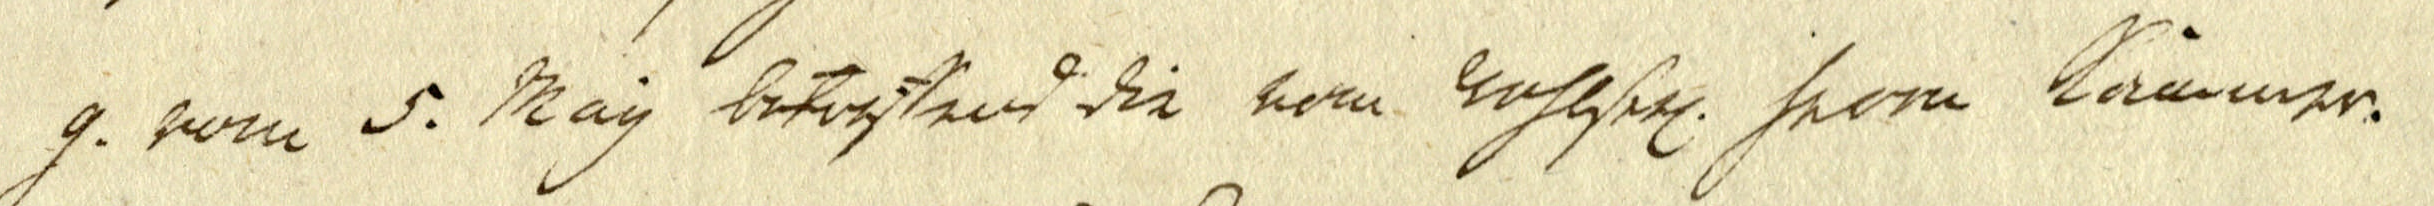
g. vom 5. Maÿ betreffend die vom Wohlseel. herrn Kammer¬
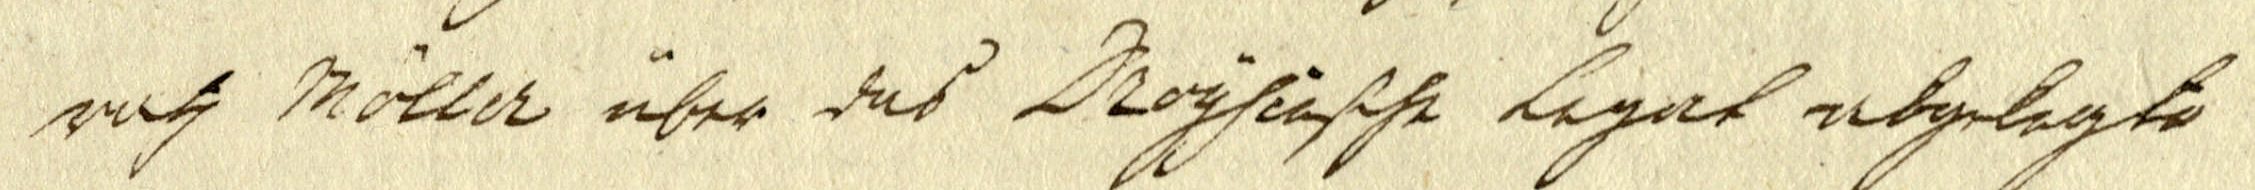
rath Möller über das Droysensche Legat abgelegte
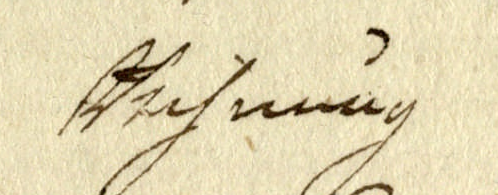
Rechnung
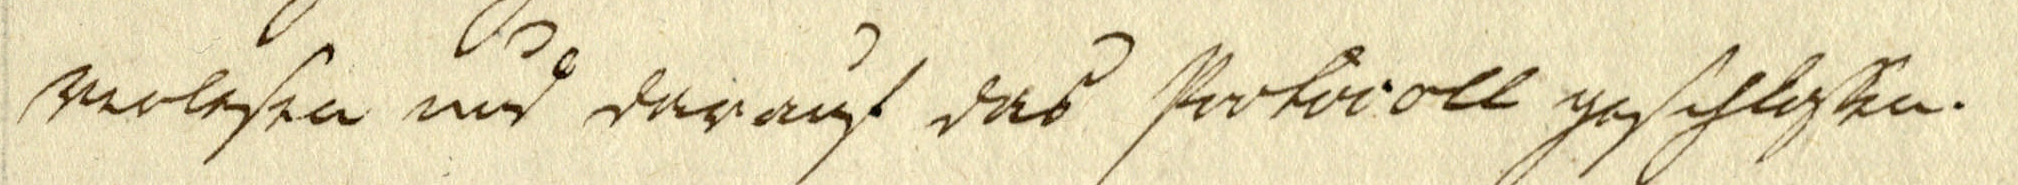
verlesen und darauf das Protocoll geschlossen.
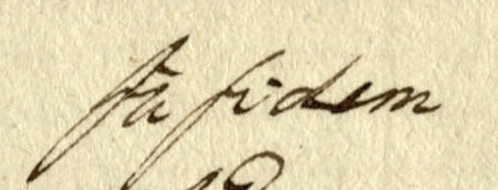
In fidem
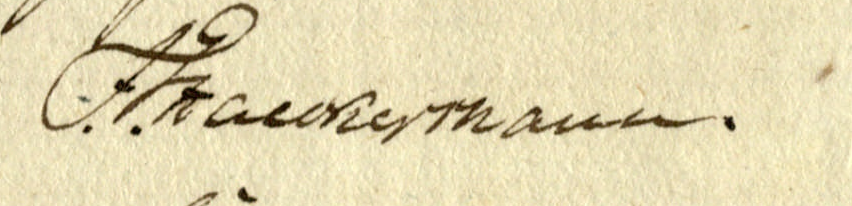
J.F. Haeckermann
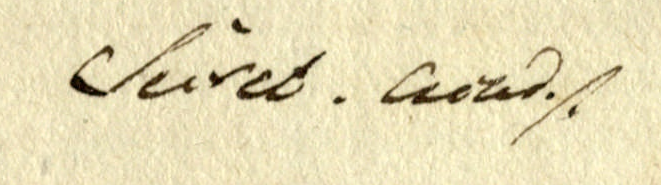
Secret. Acad. s.
